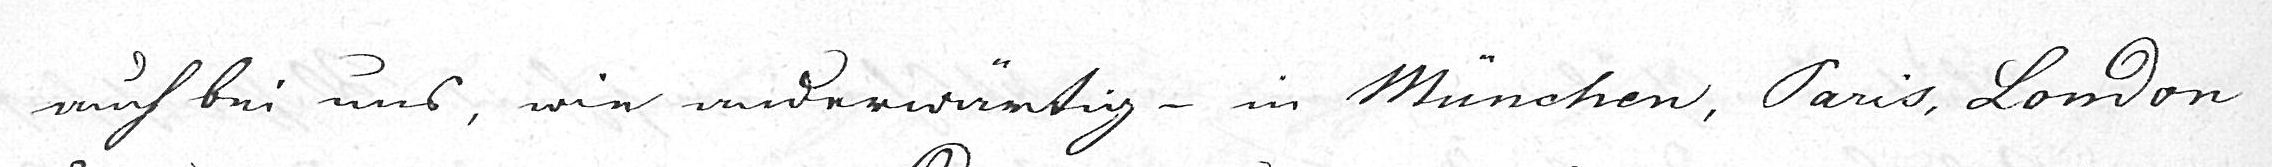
auch bei uns, wie anderwärtig in München, Paris, London
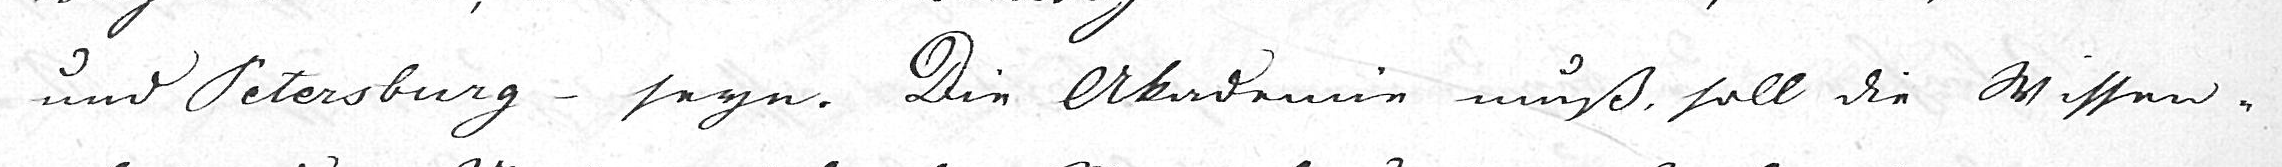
und Petersburg seyen. Die Akademie muß, soll die Wissen-
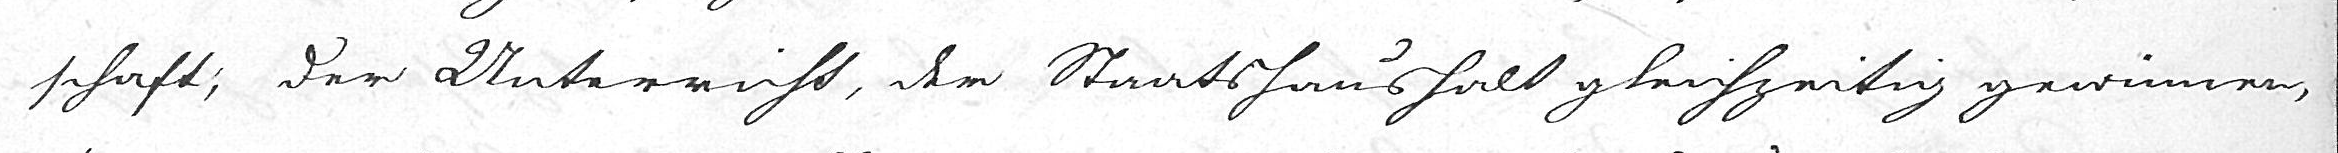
schaft, der Unterricht, der Staatshaushalt gleichzeitig gewinnen,
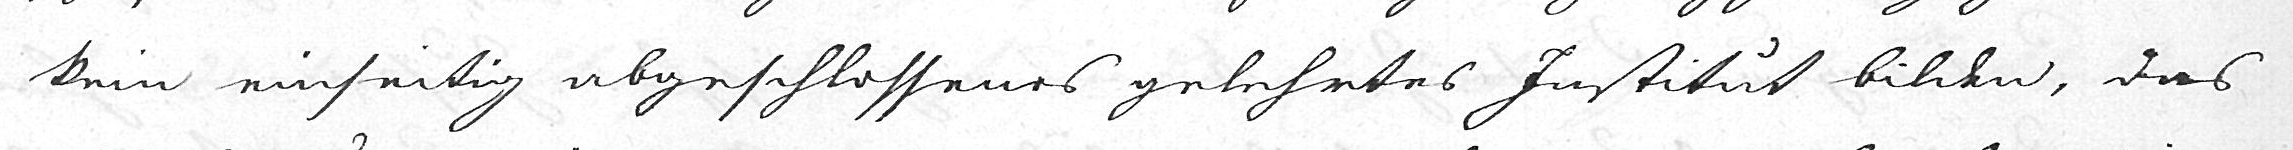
kein einseitig abgeschlossenes gelehrten Institut bilden, das
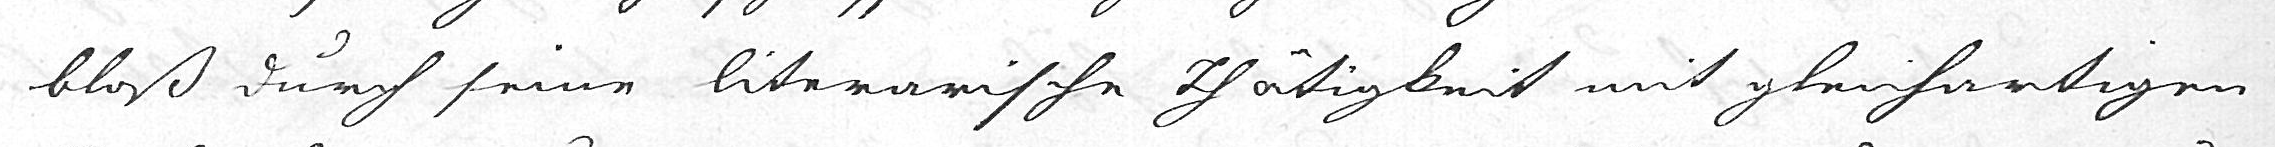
bloß durch seine literarische Thätigkeit mit gleichartigen
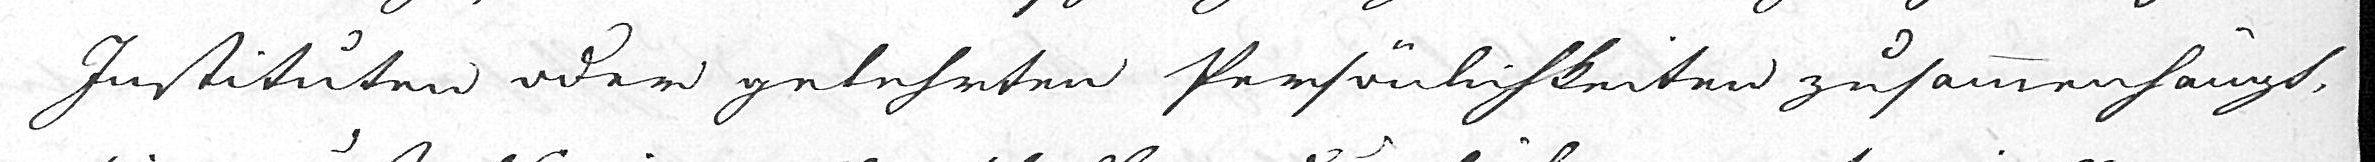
Instituten oder gelehrten Persönlichkeiten zusammenhängt,
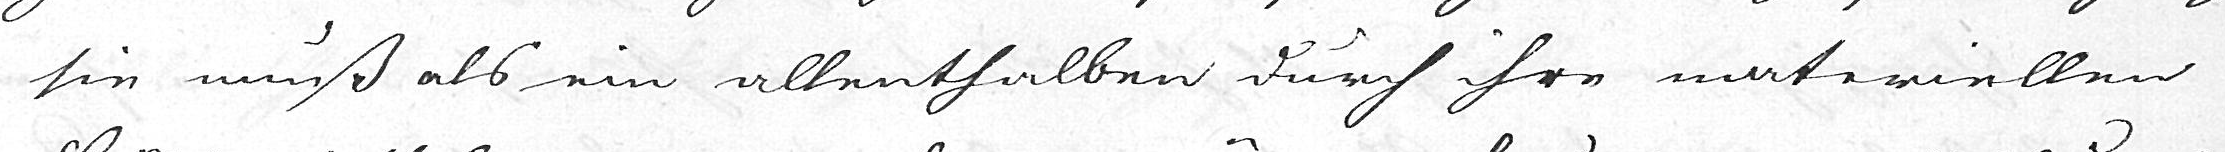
sie muß als ein allenthalben durch ihre materiellen
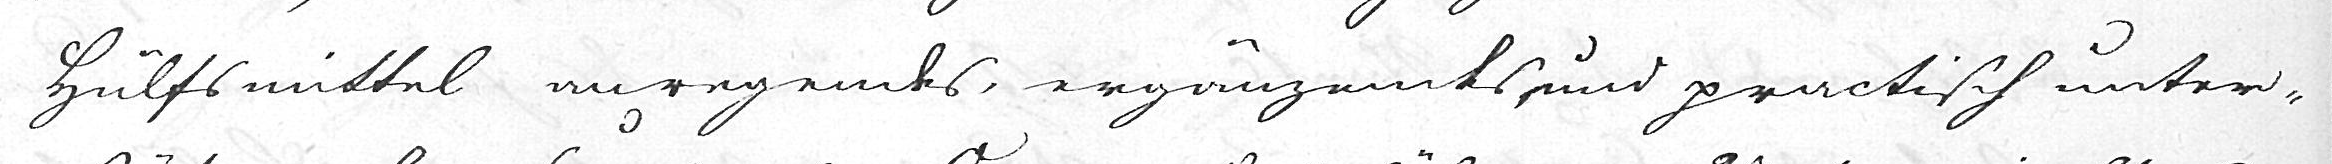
Hülfsmittel anregendes, ergänzundes und practisch unter-
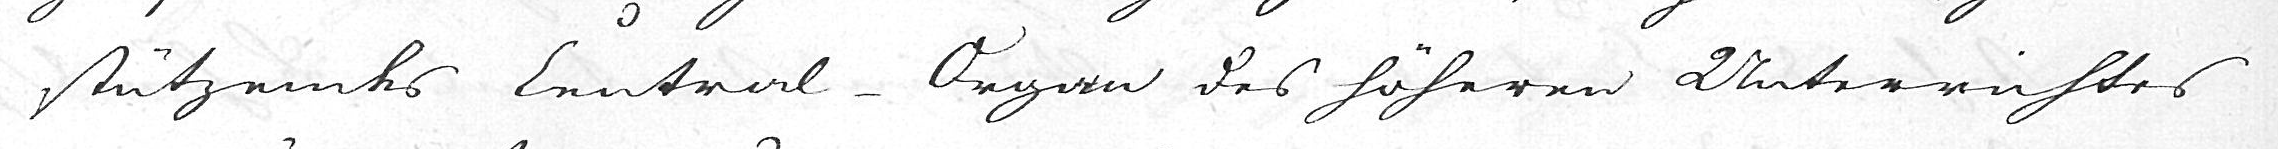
stützendes Central-Organ des höheren Unterrichtes
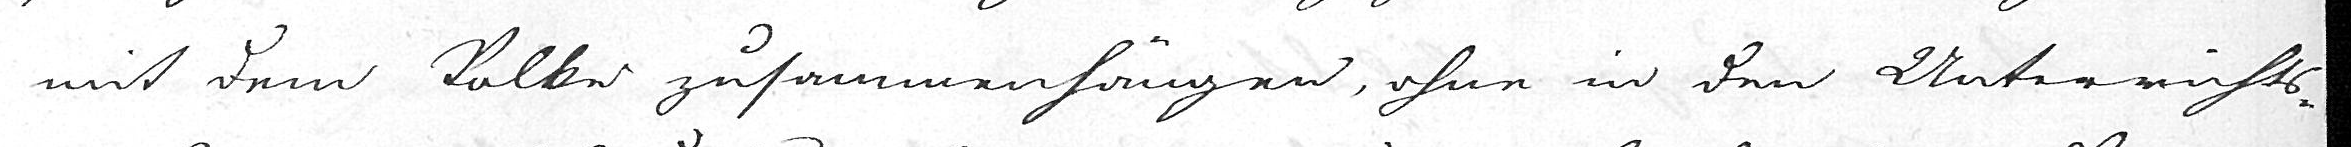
mit dem Volke zusammenhängen, ohne in den Unterrichts
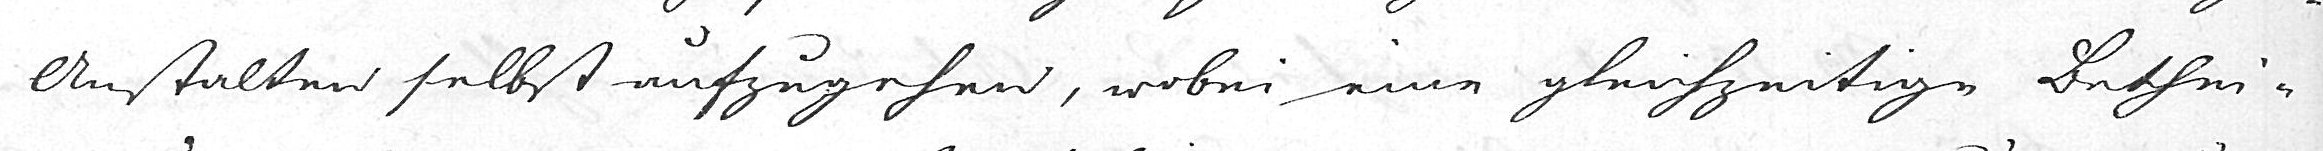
Anstalten selbst aufzugehen, wobei eine gleichzeitige Bethei-
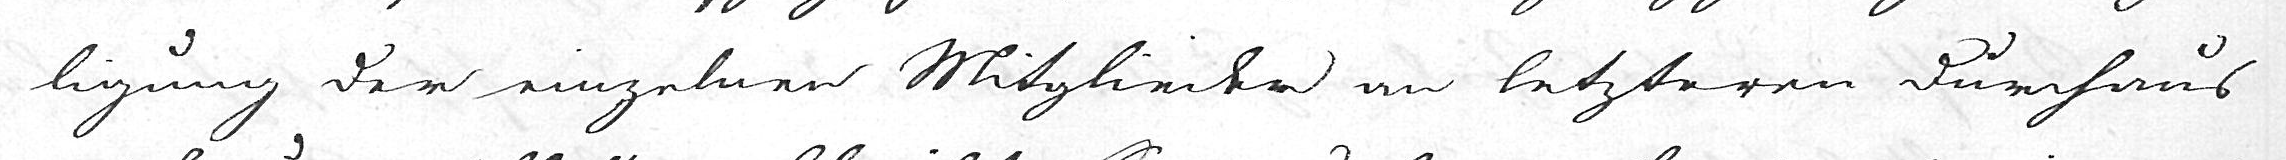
ligung der einzelnen Mitglieder an letzteren durchaus
